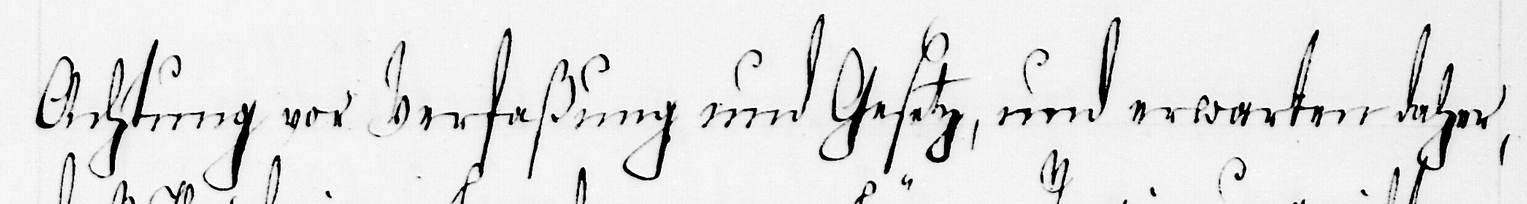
Achtung vor Verfaßung und Gesetz, und erwarten daher,
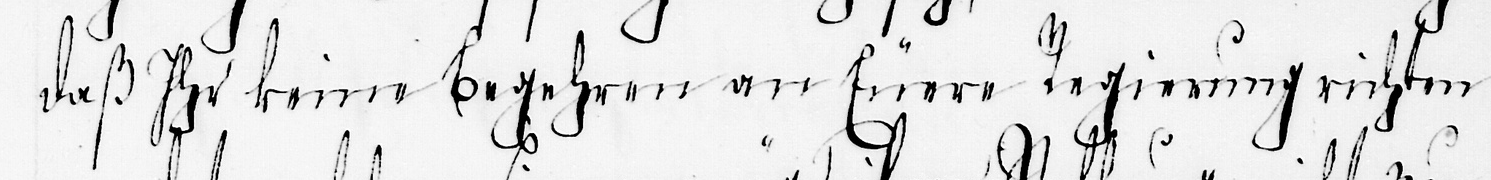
daß Ihr keine Begehren an Euere Regierung richten
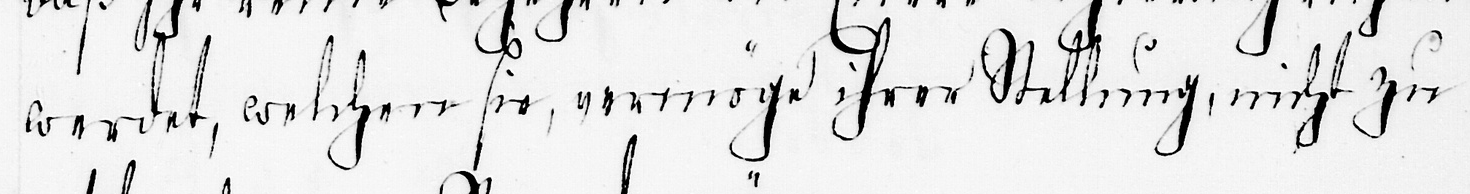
werdet, welchen sie, vermöge ihrer Stellung, nicht zu
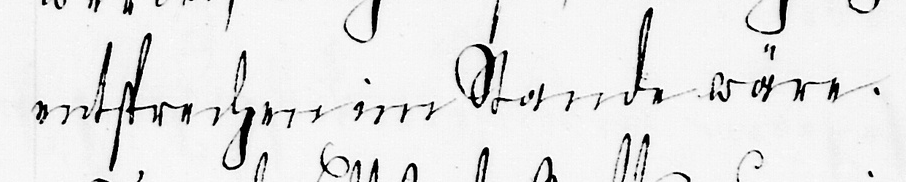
entsprechen im Stande wäre.
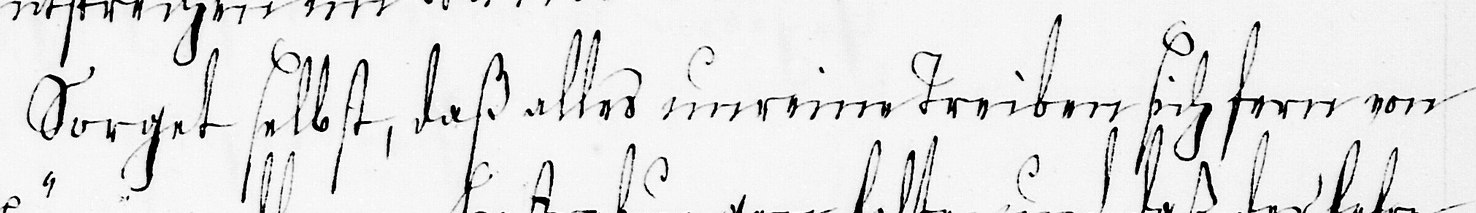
Sorget selbst, daß alles unreine Treiben sich fern von
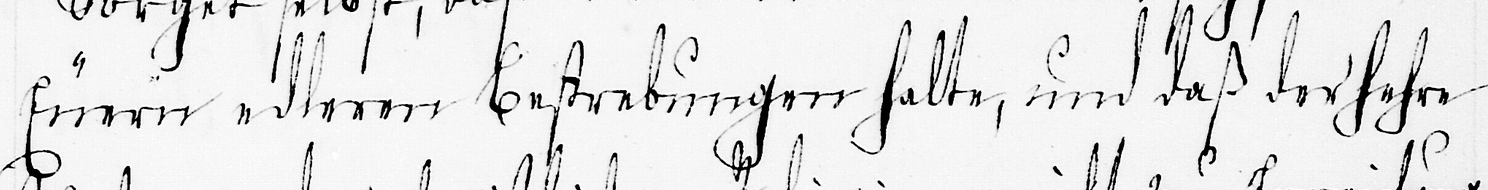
Euern edleren Bestrebungen halte, und daß der hehre
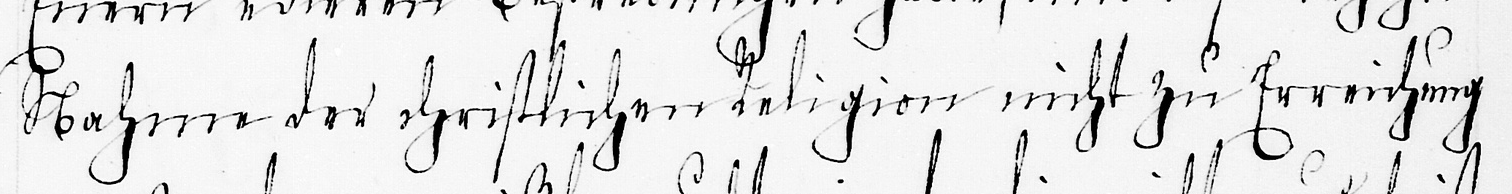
Nahme der christlichen Religion nicht zu Erreichung
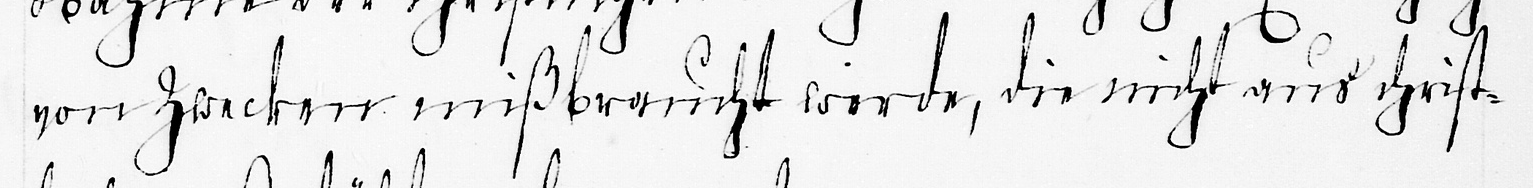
von Zwecken mißbraucht werde, die nicht aus christ¬
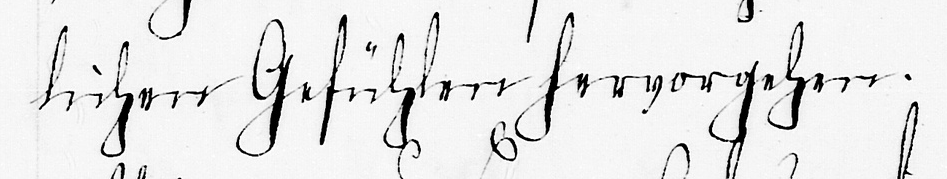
lichen Gefühlen hervorgehen.
